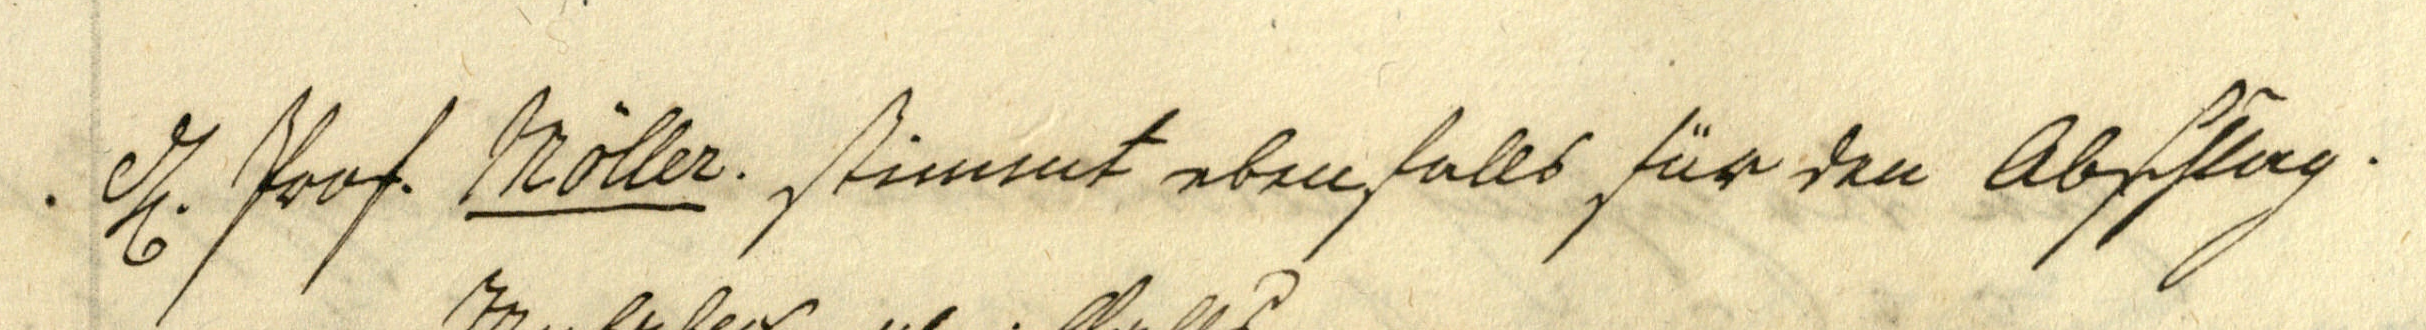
d.h. Prof. Möller. stimmt ebenfalls für den Abschlag.
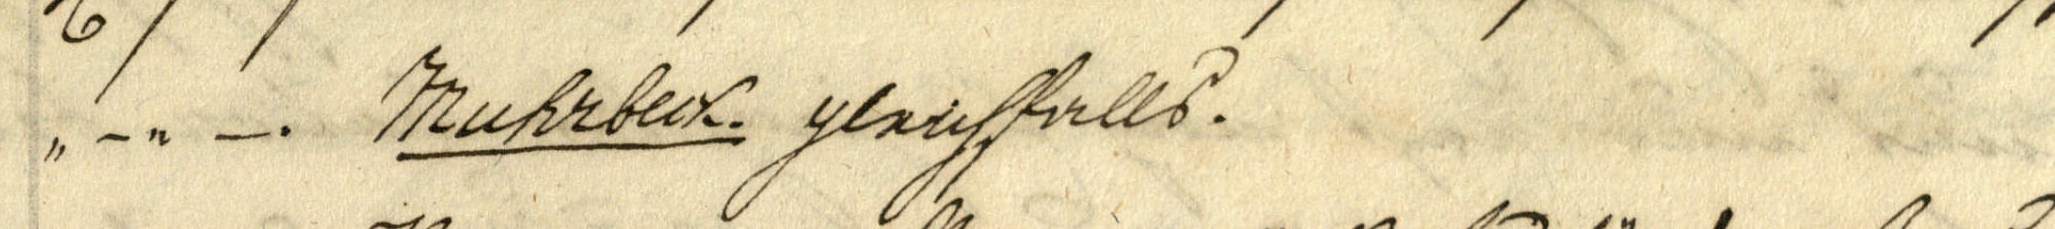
" - " - " Muhrbeck. gleichfalls.
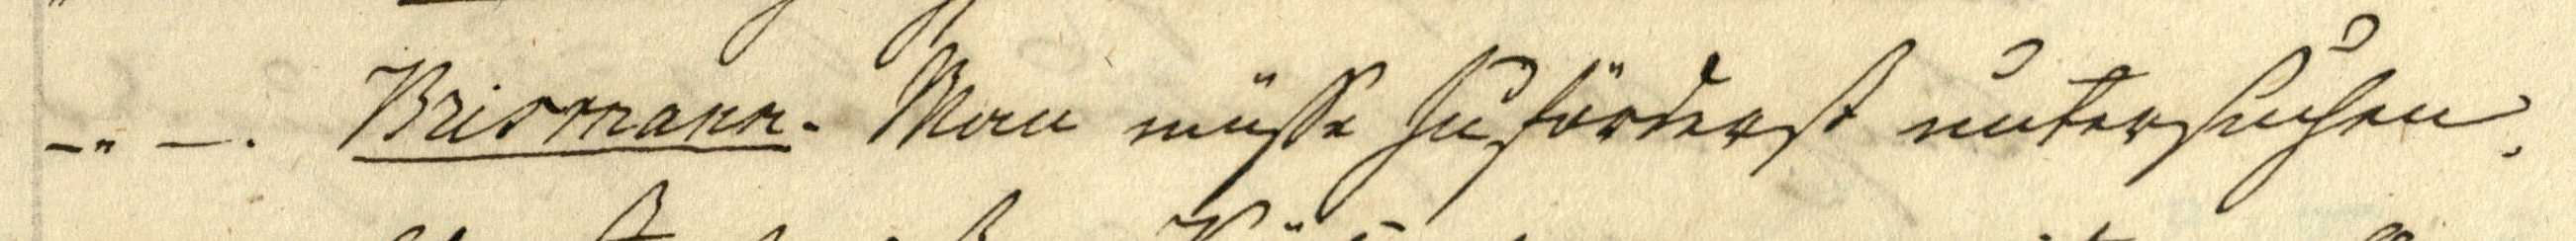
- " - " Brismann. Man müsse zuföderst untersuchen,
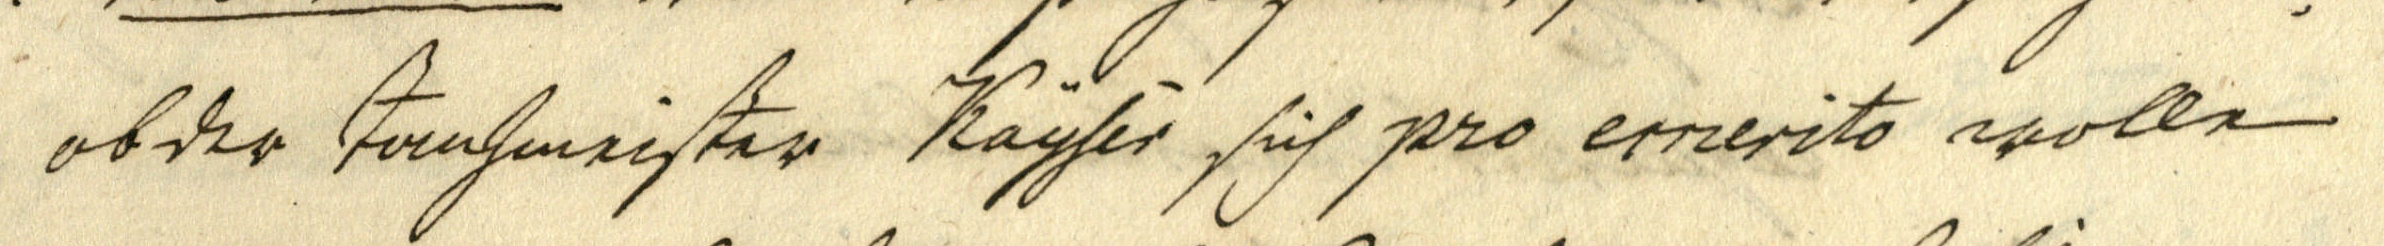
ob der Tanzmeister Kayser sich pro emerito wolle
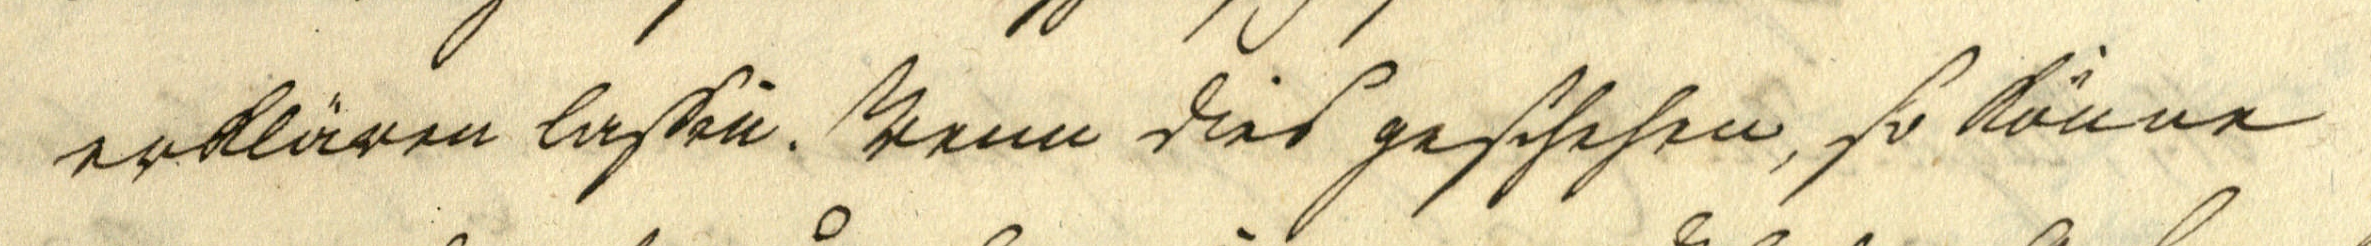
erklären lassen. Wenn dies geschehen, so könne
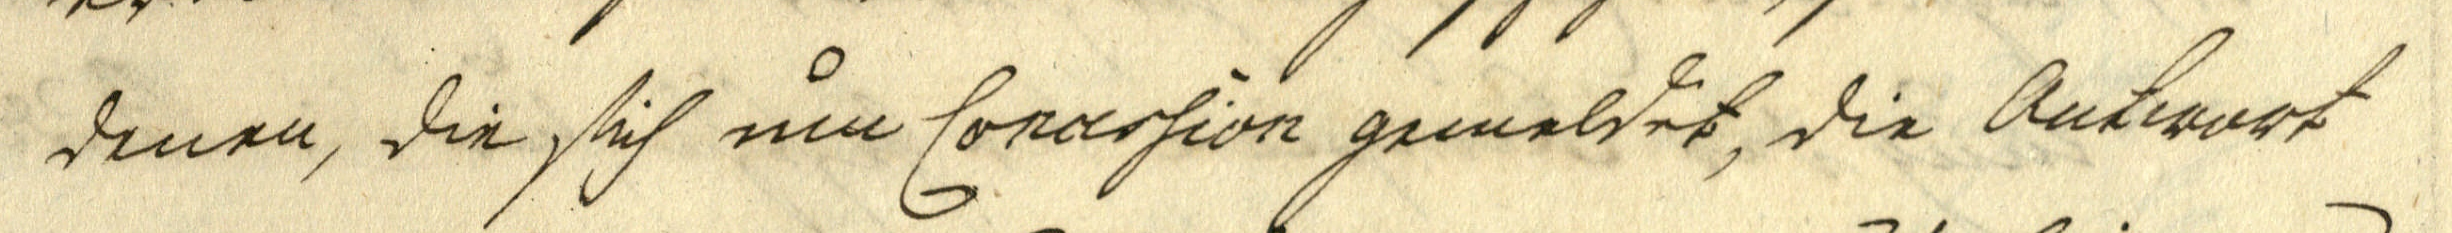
denen, die sich um Concession gemeldet, die Antwort
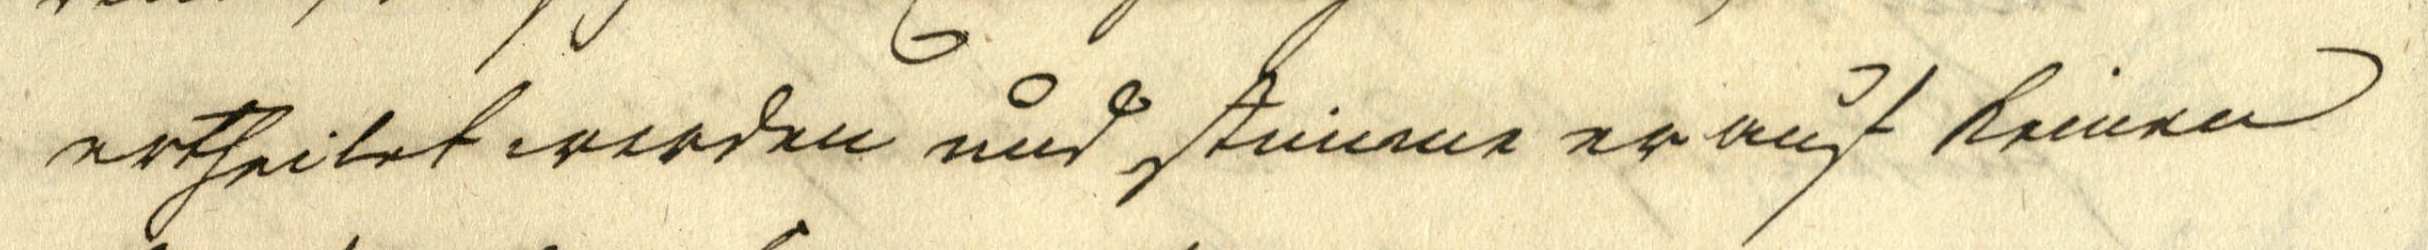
ertheilet werden und stimme er auf keinen
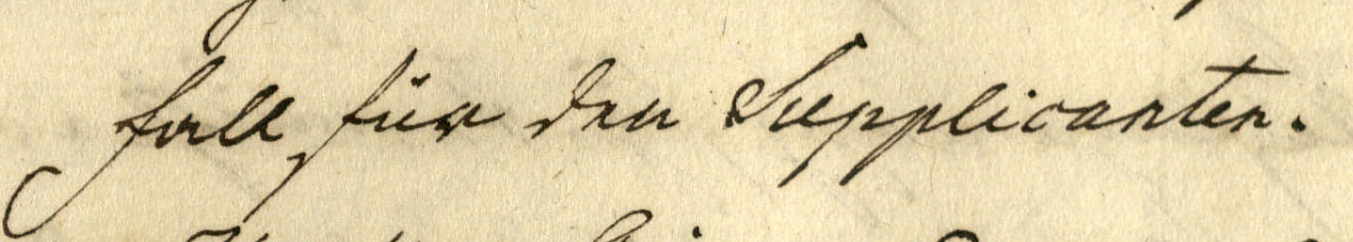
Fall für den Supplicanten.
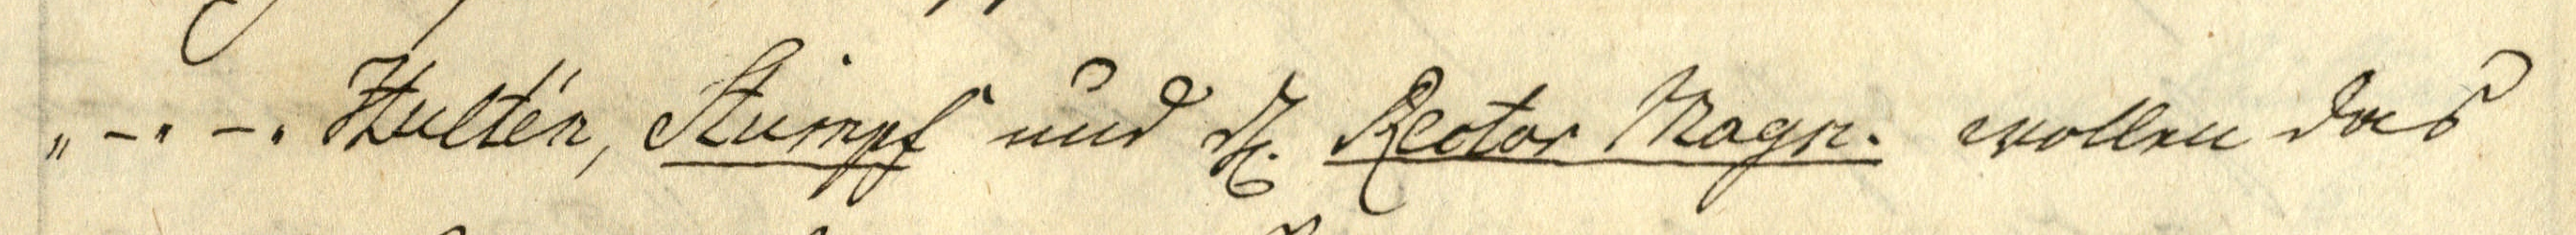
" - " - " Hultén, Stumpf und d.h. Rector Magn. wollen das
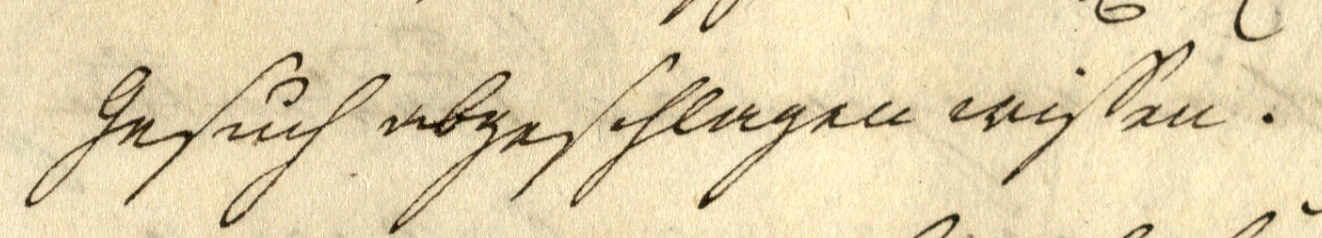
Gesuch abgeschlagen wissen.
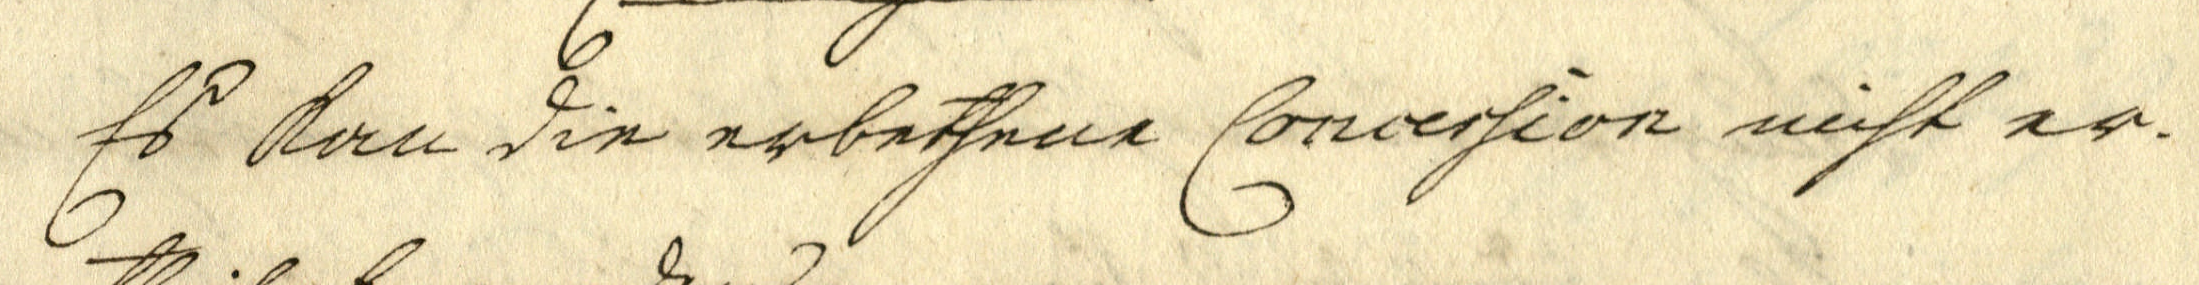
Es kan die erbethene Concession nicht er-
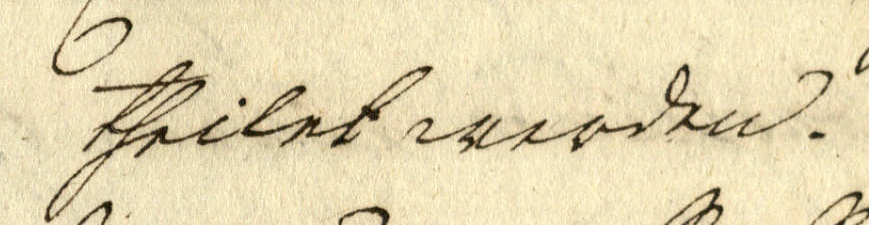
theilet werden.
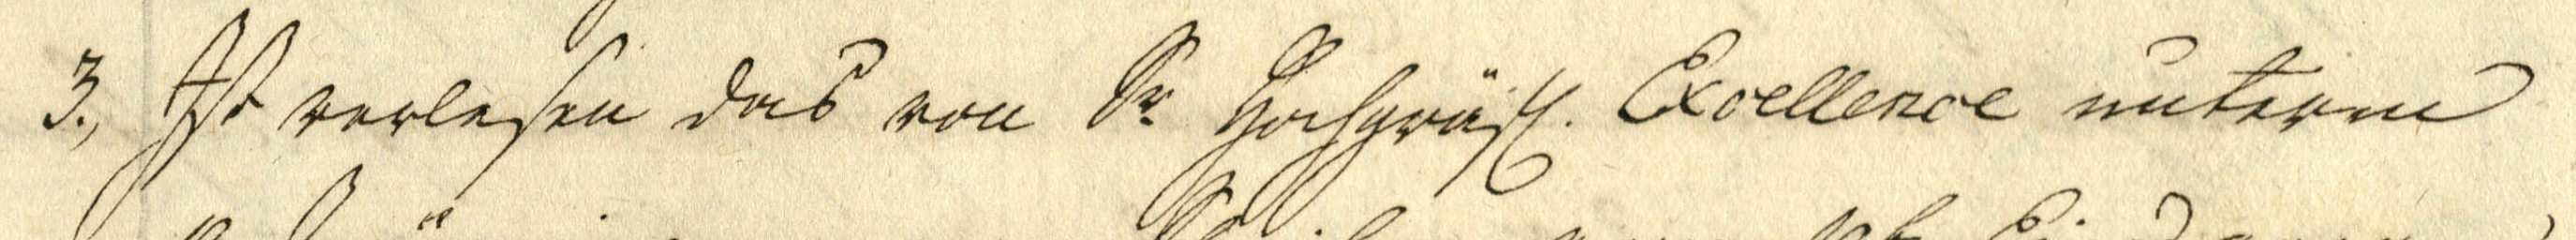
3., Ist verlesen das von Sr. Hochgräfl. Excellence unterm
